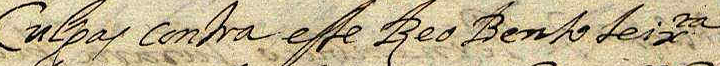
Culpas contra este Reo Bento teixra
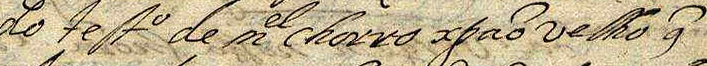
do testo de mel chorro xpaõ velho q̄
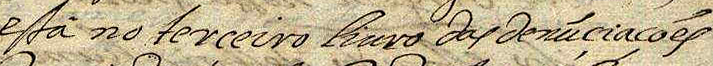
está no terçeiro liuro das denūçiaçoẽs
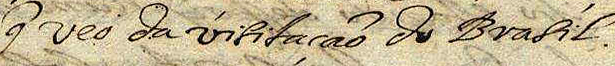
q̄ veo da visitaçaõ do Brasil.
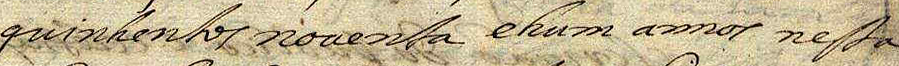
quinhentos nouenta e hum annos nesta
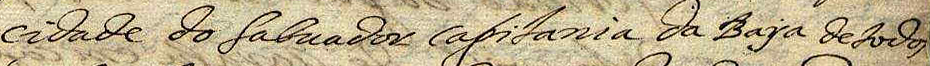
çidade do saluador capitania da Baya de todos
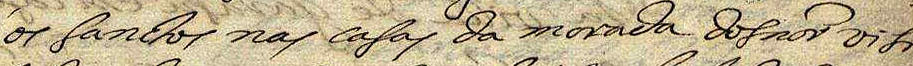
os sanctos nas casas da morada do snor̄ visi
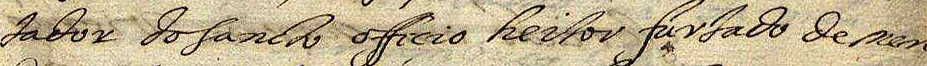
tador do sancto offiçio heitor furtado de Men
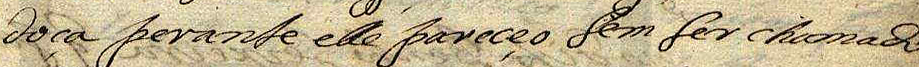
doça perante elle pareçeo sem ser chamado
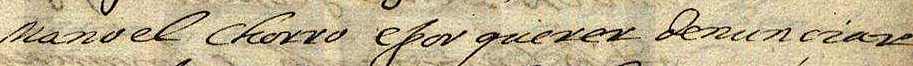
Manoel Chorro e por querer denunçiar
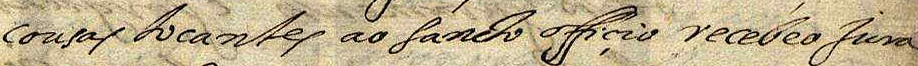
cousas tocantes ao sancto offiçio recebeo Jura
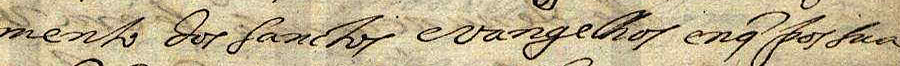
mento dos sanctos evangelhos en q̄ pos sua
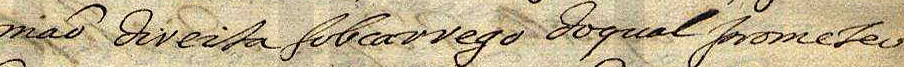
maõ direita sob carrego do qual prometeo
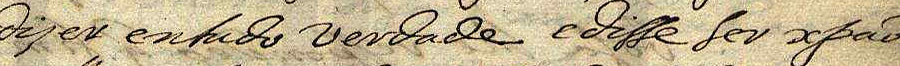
dizer en tudo verdade e disse ser xpaõ
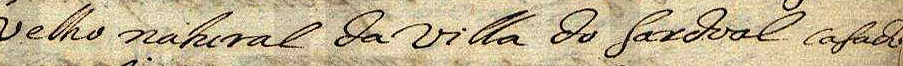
velho natural da villa do sardoal casado
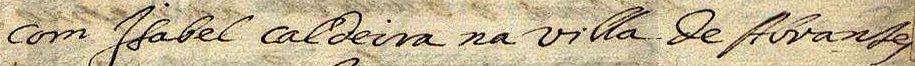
com Jsabel caldeira na villa de Abrantes
